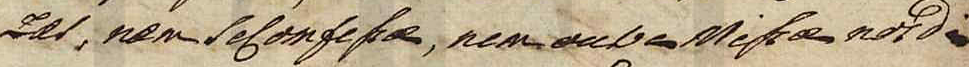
zas, nam se Comfessa, nem ouve Missa nos di
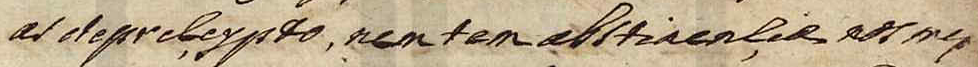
as de preçeypto, nem tem abstinençia aos mes
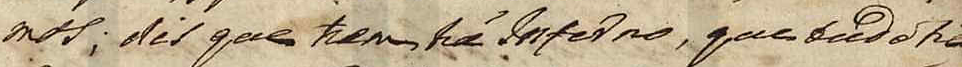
mos; dis que nem há Inferno, que tudo hé
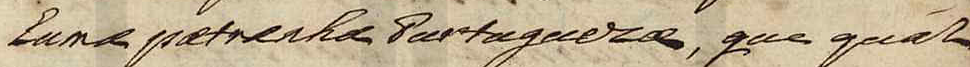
huma patranha Purtugueza, que qual
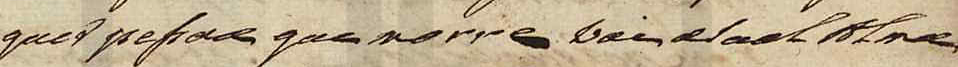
quer pessoa que morre vai a sual ALma
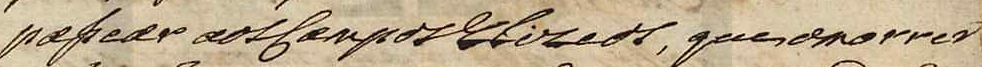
passear aos Campos Elizeos, que o morrer
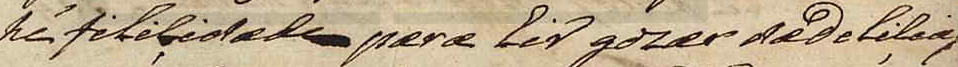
hé fiLiçidade para hir gozar da deLiçias
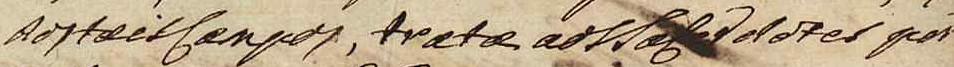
Aos tais Campos, trata aos SaCerdotes por
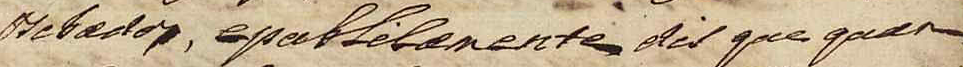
Bebados, e pubLicamente dis que quan
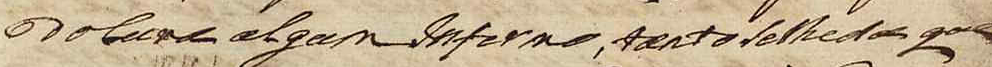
do Cura algum Infermo, tanto se lhe da que
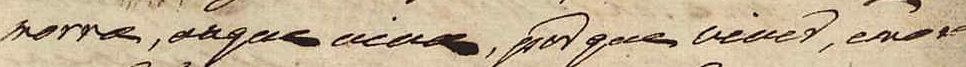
morra, ou que viva, porque viver, e mor
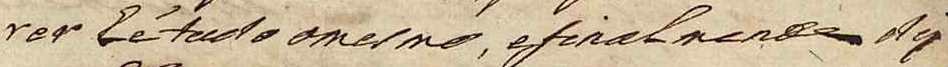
rer hé tudo o mesmo, e finalmente dis
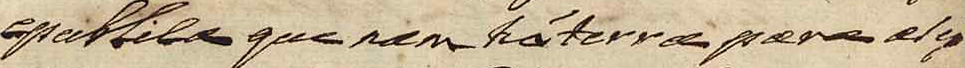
e pubLica que nam há terra para asis
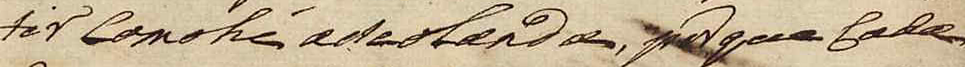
tir como hé a de oLanda, porque Cada
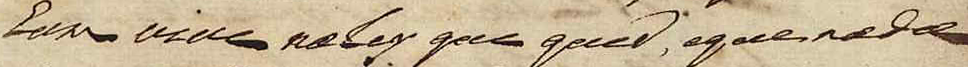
hum vive na Ley que quer, e que nada
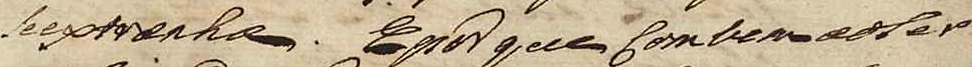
se extranha. E por que Comvem ao ser
